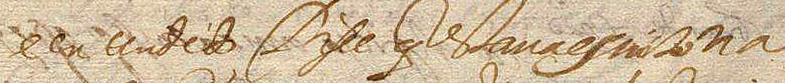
e entendido Disse q̄ estaua escrito na
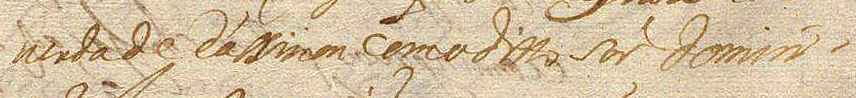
uerdade e assinou com o ditto sor̄ domin
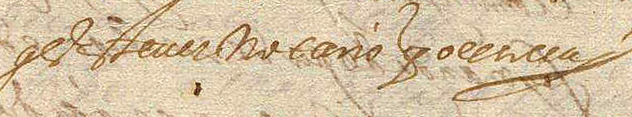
gos esteues notario q̄ o escreuy
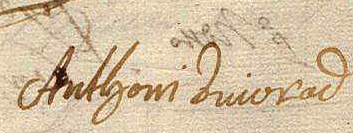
Anthoni Guirrad
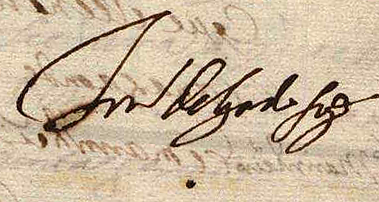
Joaõ delgado figa
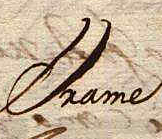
Exame
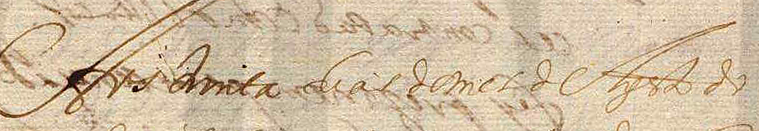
Aos trinta dias do mes de Agosto do
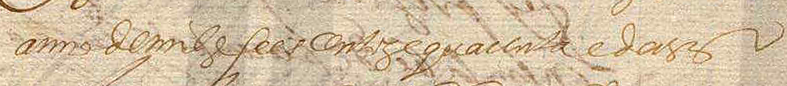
anno de mil e seiscentos e quarenta e dous
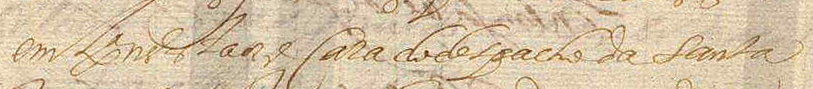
em Lxa nos estaos e Caza do despacho da santa
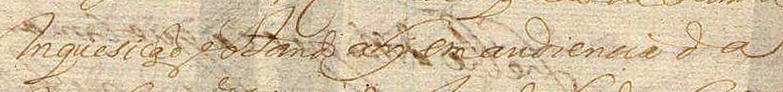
Inquisiçaõ estando ahy em audiencia da
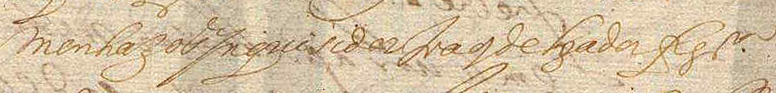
menhā o sor Jnquisidor Joaõ delgado fig.ra
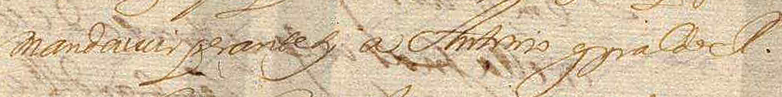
mandou uir perante sy a Antonio gyraldo R.
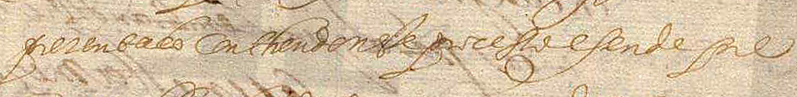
prezentado contheudo neste processo e sendo pre
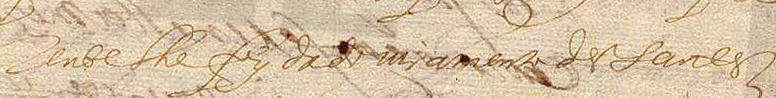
zente lhe foy dado iuramento dos santos
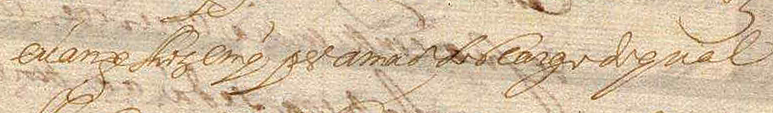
euangelhos em q̄ pos a maõ sob cargo do qual
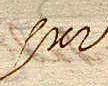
jur
